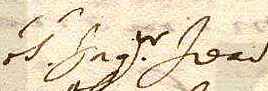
S. Jnq.or Joaõ
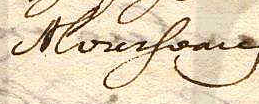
Alvres soares
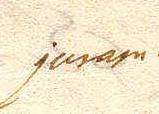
juram.
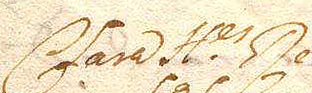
Clara H.es Ré
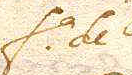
f.a de
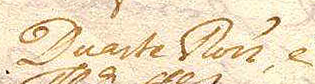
Duarte Roiz̄, e
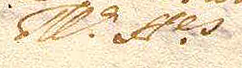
M.a H.es
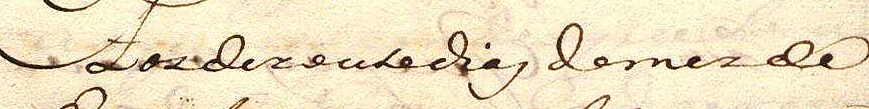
Aoz dezouto dias do mez de
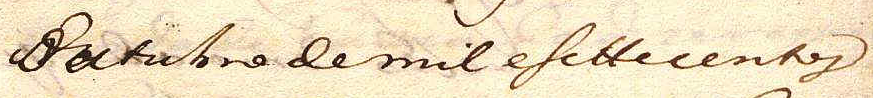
Outubro de mil e settecentos
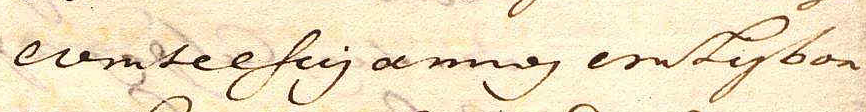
e vinte e seis annos em Lisboa
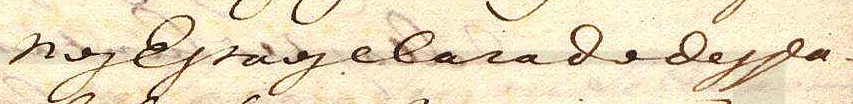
nos Estaos e Caza do despa
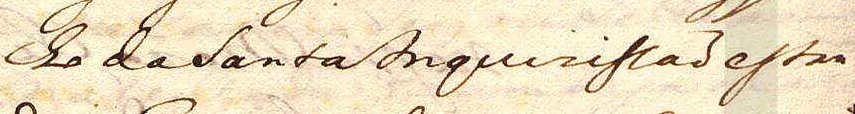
cho da Santa Inquizissaõ estan
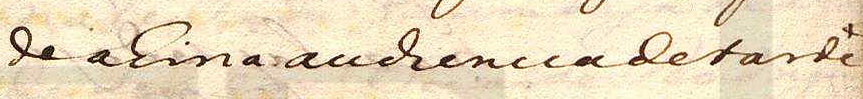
do ahi na audiencia de tarde
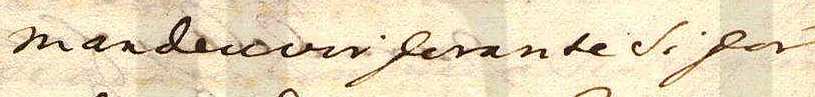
mandou vir perante si por
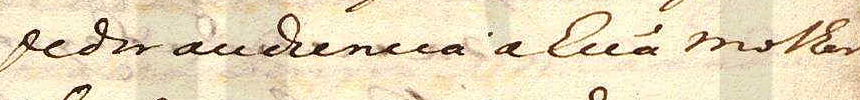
pedir audiencia a huā molher
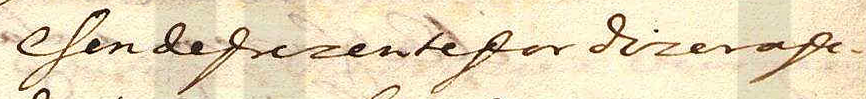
e sendo prezente por dizer a pe
